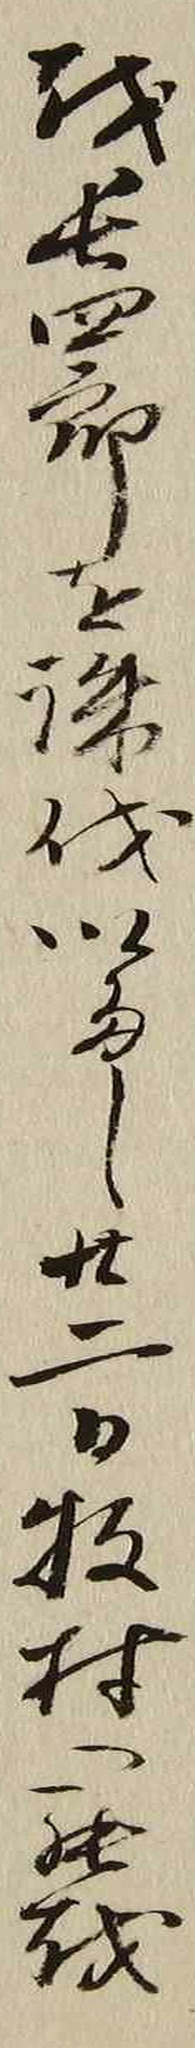越長四郎を伐誅いたし廿二日牧村へ罷越
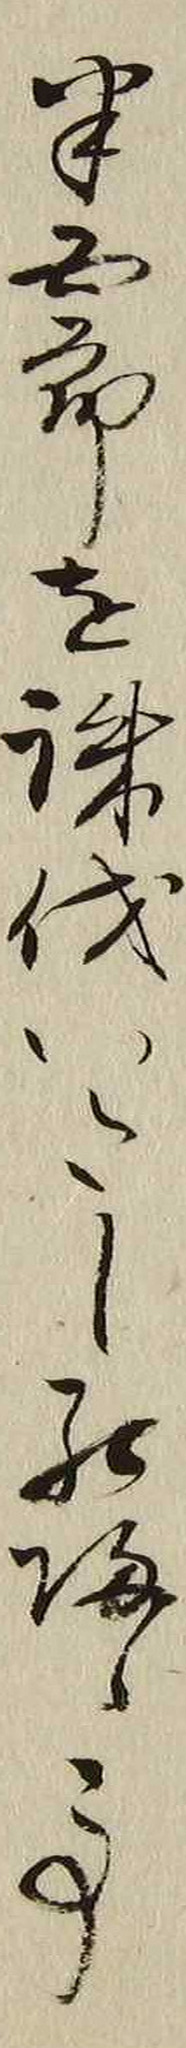半五郎を伐誅いたし罷帰候事
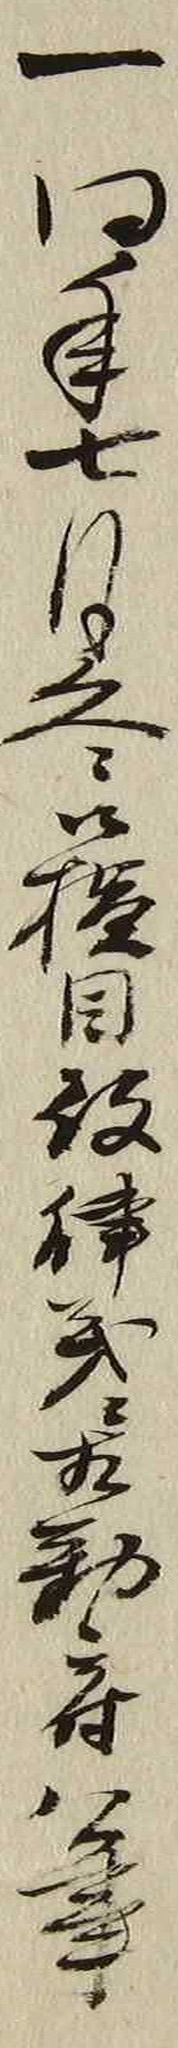一同年七月久々ニ御横目役律義ニ相勤候ニ付公事
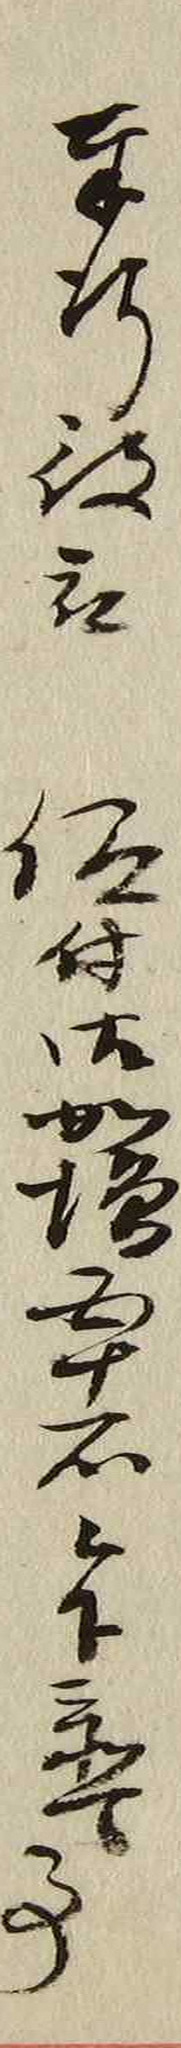奉行役被仰付御加増五十石被下置候事
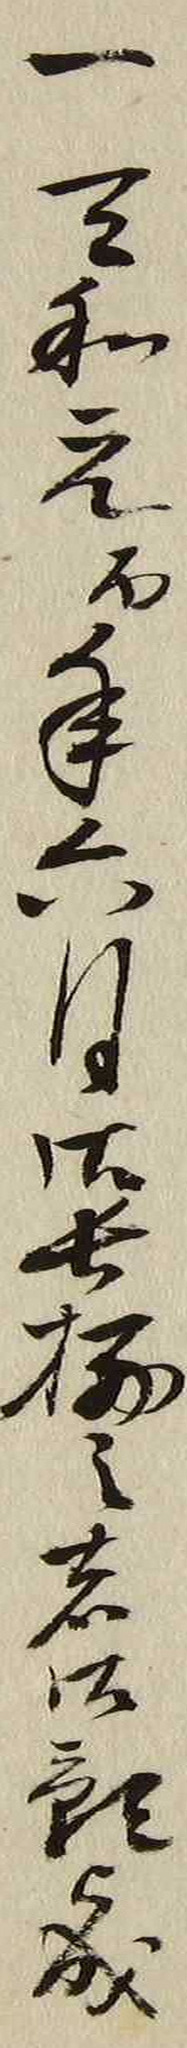一天和元酉年六月御長柄之者御預被成
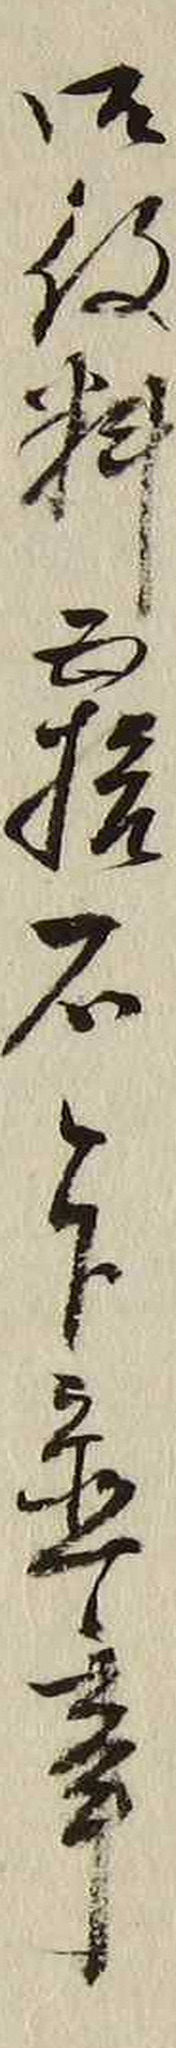御役料五拾石被下置候事
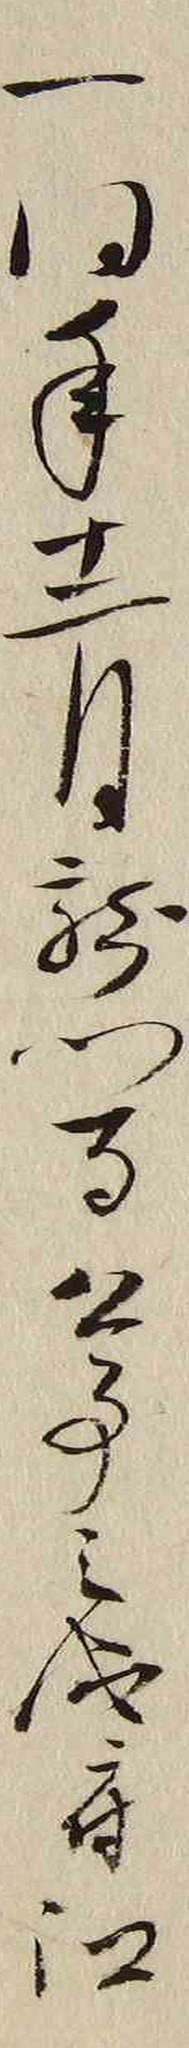一同年十二月龍門寺公事之儀ニ付江
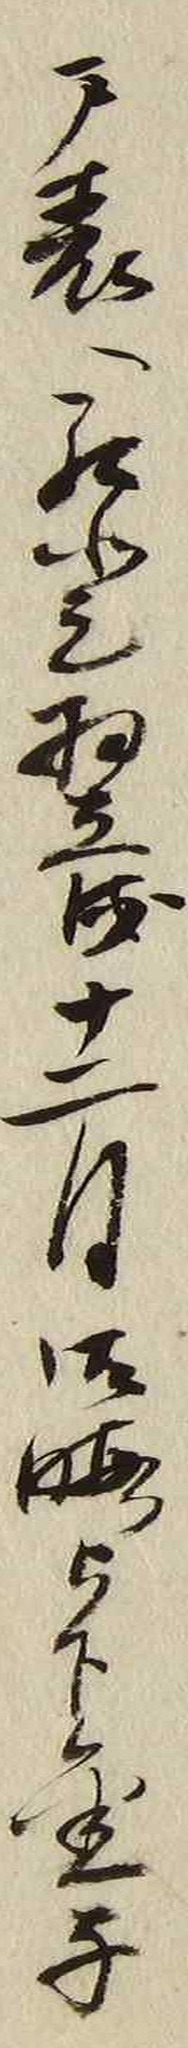戸表へ罷登翌戌十二月御暇被下金子
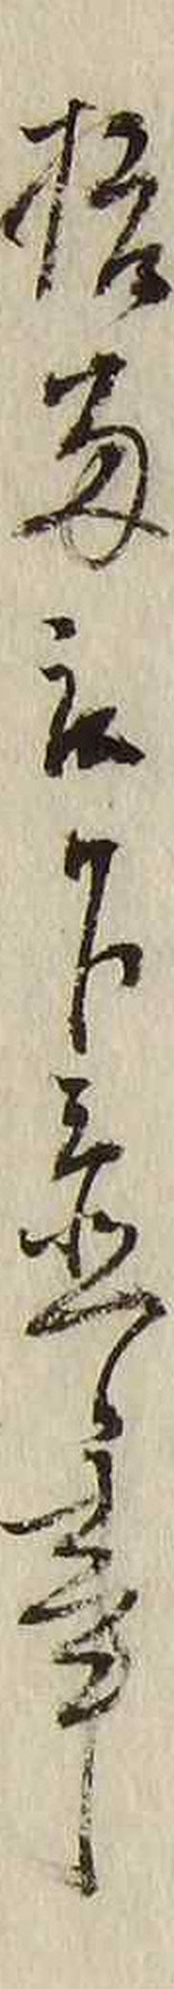拾両被下置候事

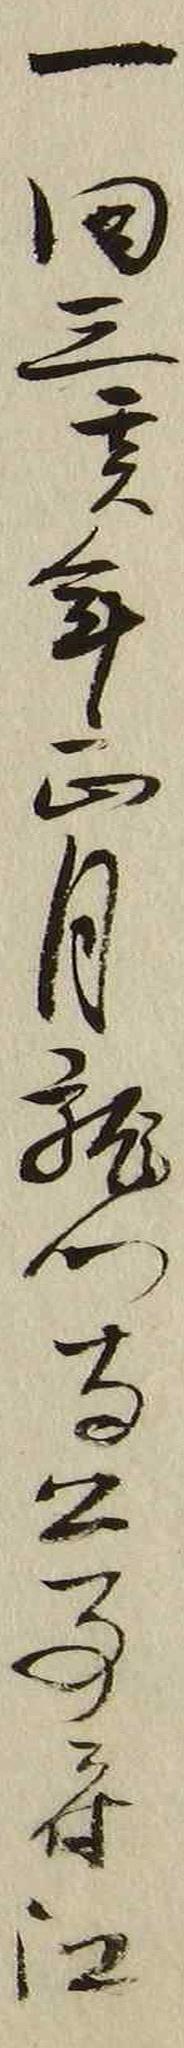一同三亥年正月龍門寺公事ニ付江
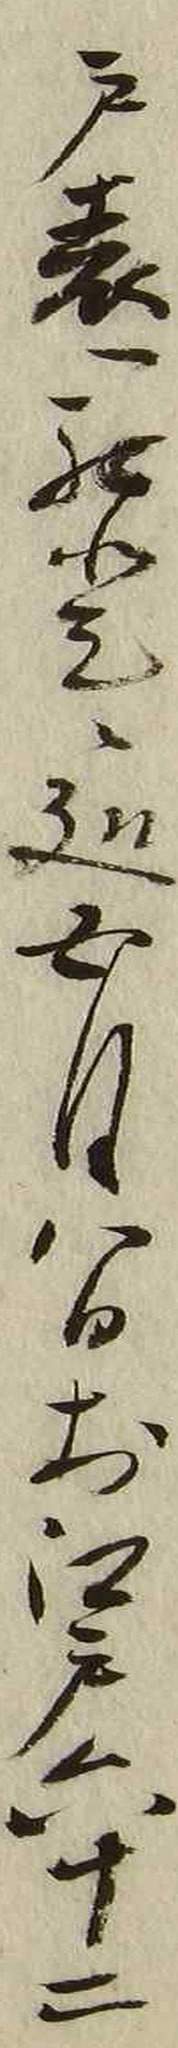戸表へ罷登候処五月八日於江戸六十二
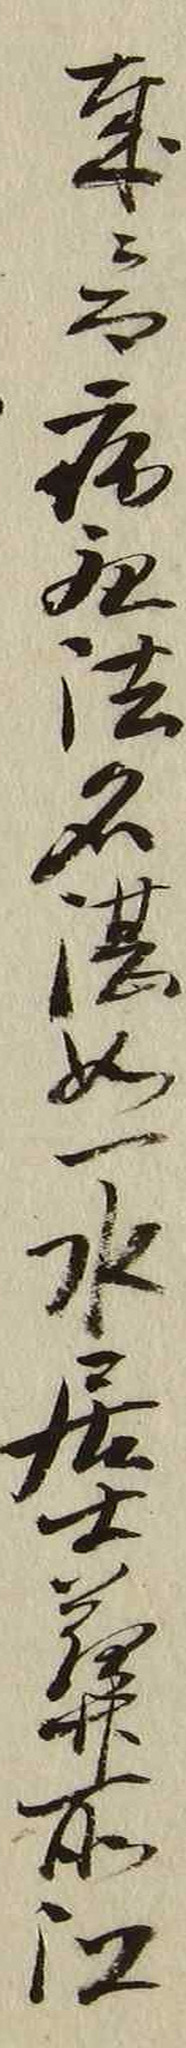歳ニ而病死法名湛如一水居士葬所江
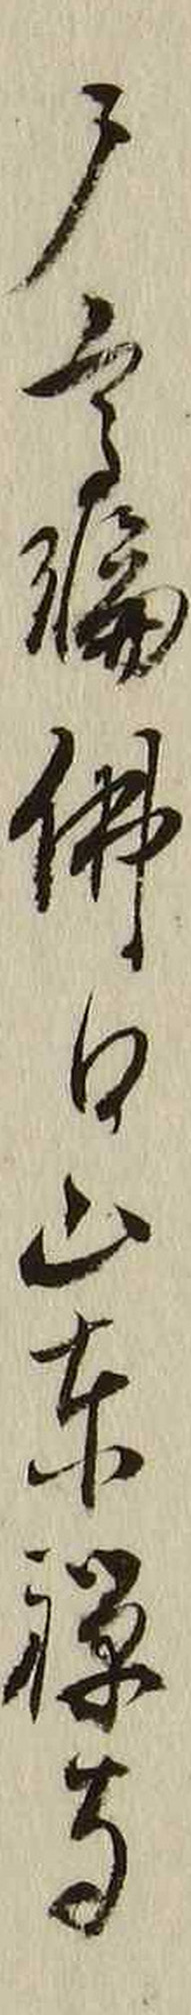戸高輪仏日山東禅寺
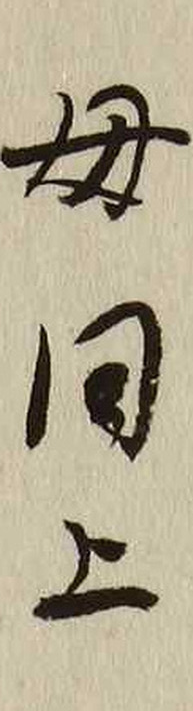母同上
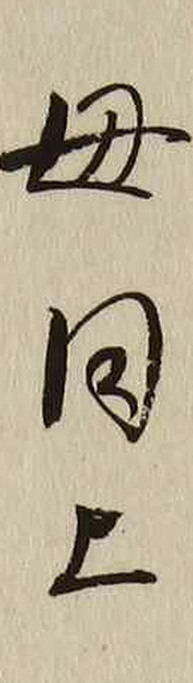母同上
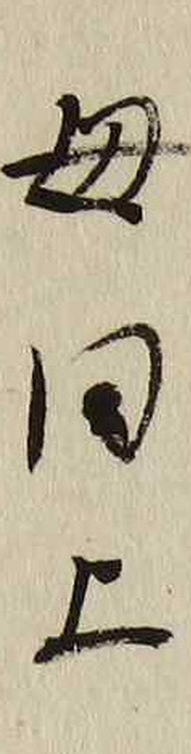母同上
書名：諸士系譜　巻之352　す之部2
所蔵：会津若松市立会津図書館
